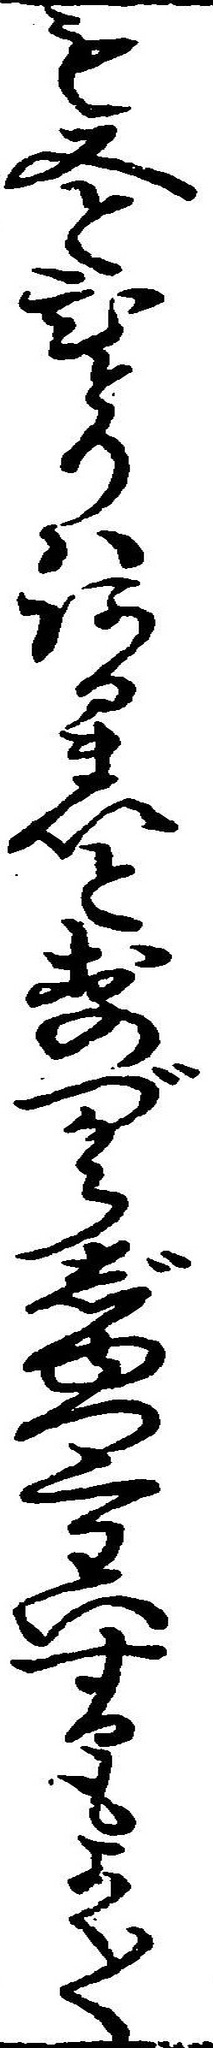も又とひとりはあるまいとおのづからじゆつくわいするもよく〳〵
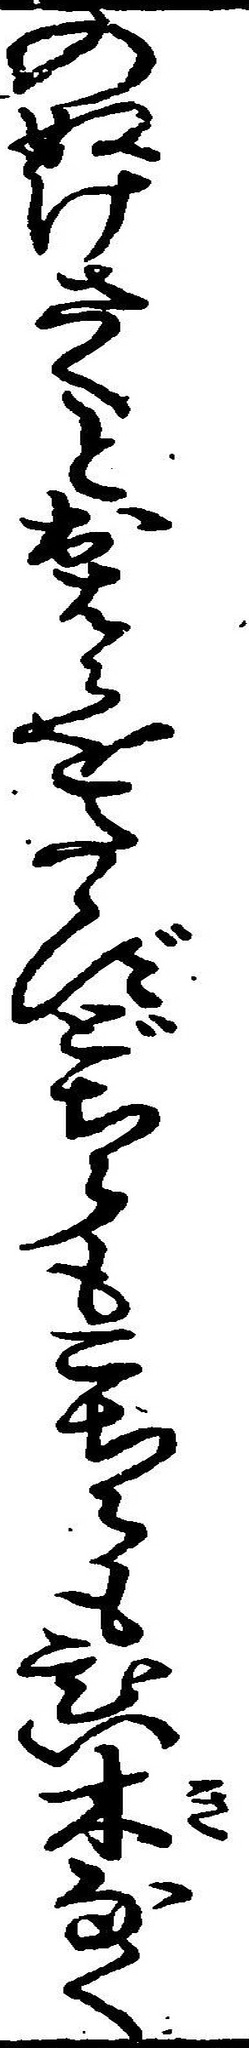のぬけさくとおはらをたゝずどちらもこちらもひい木なく
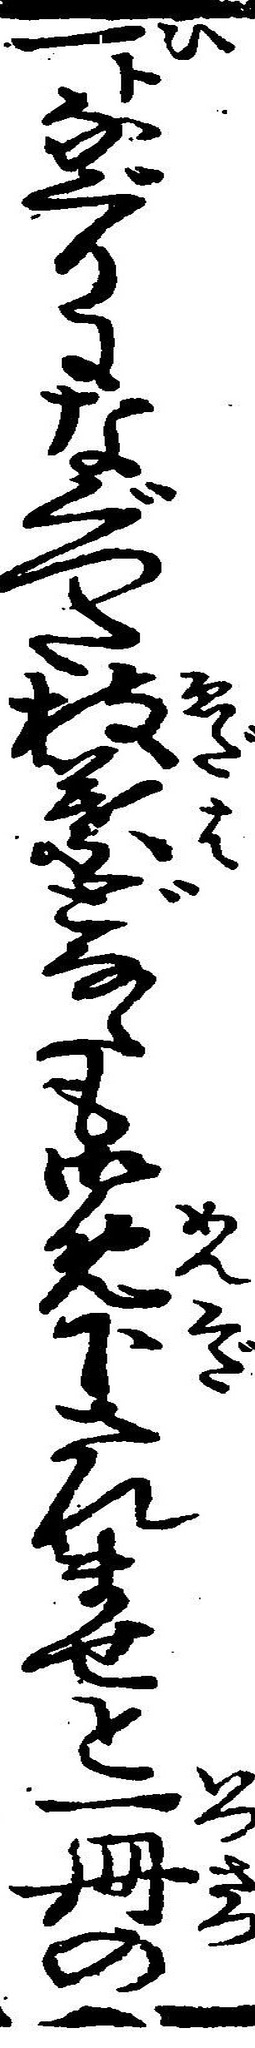一なぐりになぐつた枝葉どなたも御免下されませと一冊の
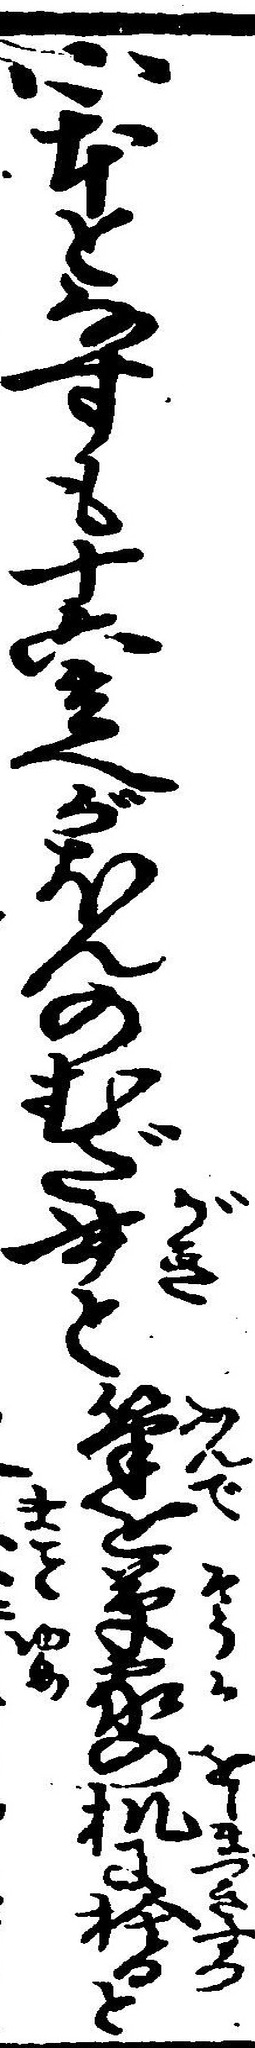小本となすも十六兵衛がほんのむだ書と筆を草家の机に捨ると
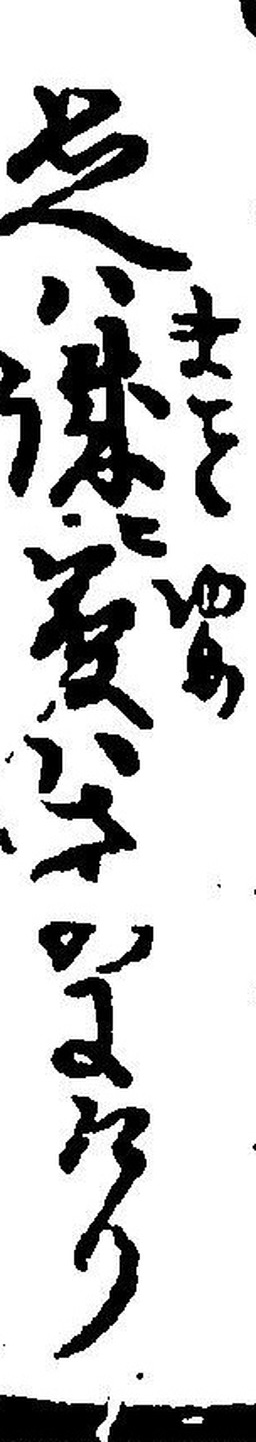思へは誠夢はさめにけり
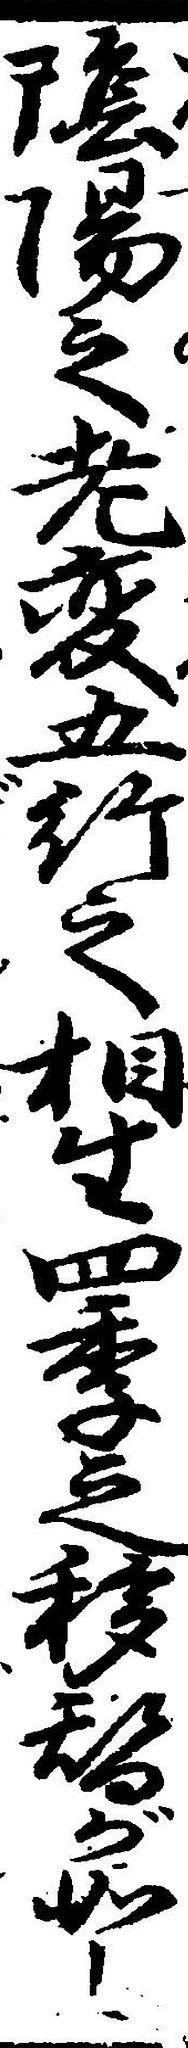陰陽之老変五行之相生四季之移替が如し
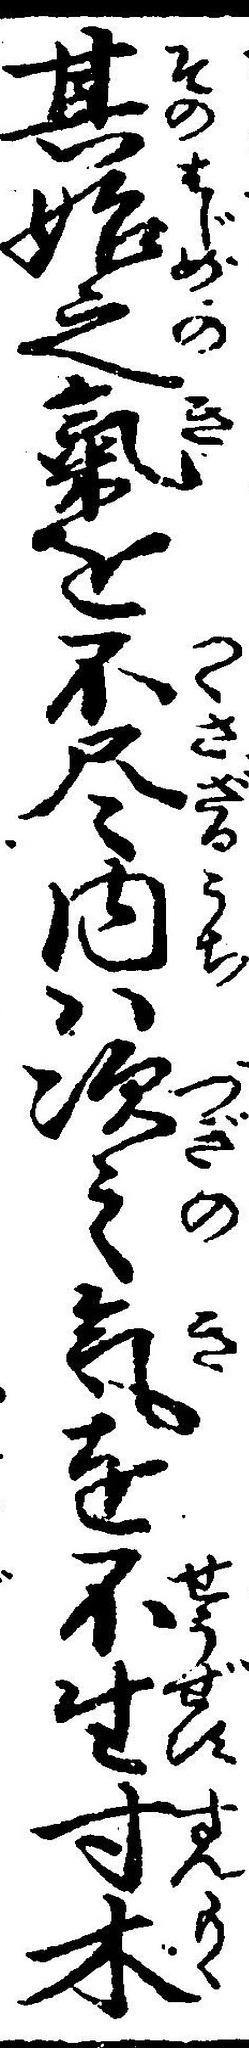其始之気を不尽内は次之気を不生寸木
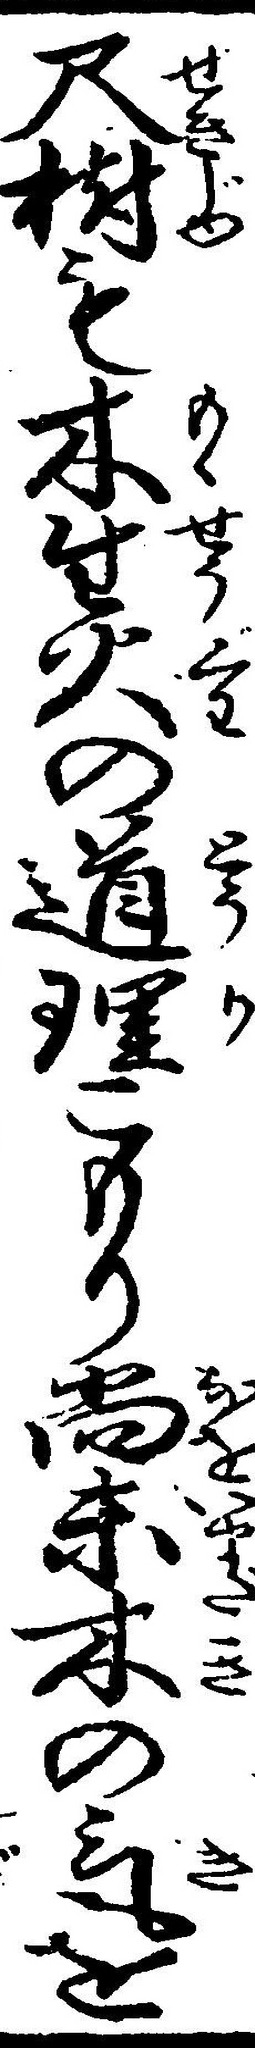尺樹も木生火の道理こもり尚未木の気を
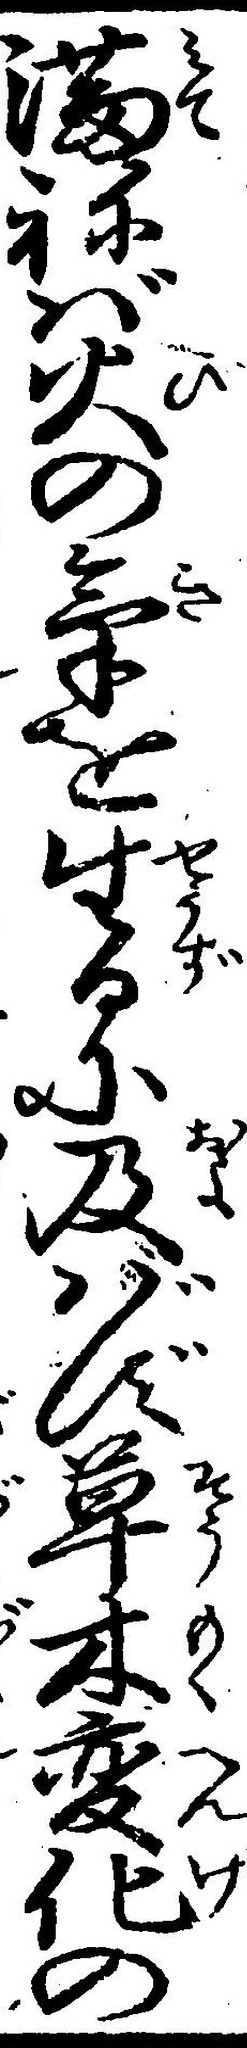満ねば火の気を生るに及ばず草木変化の
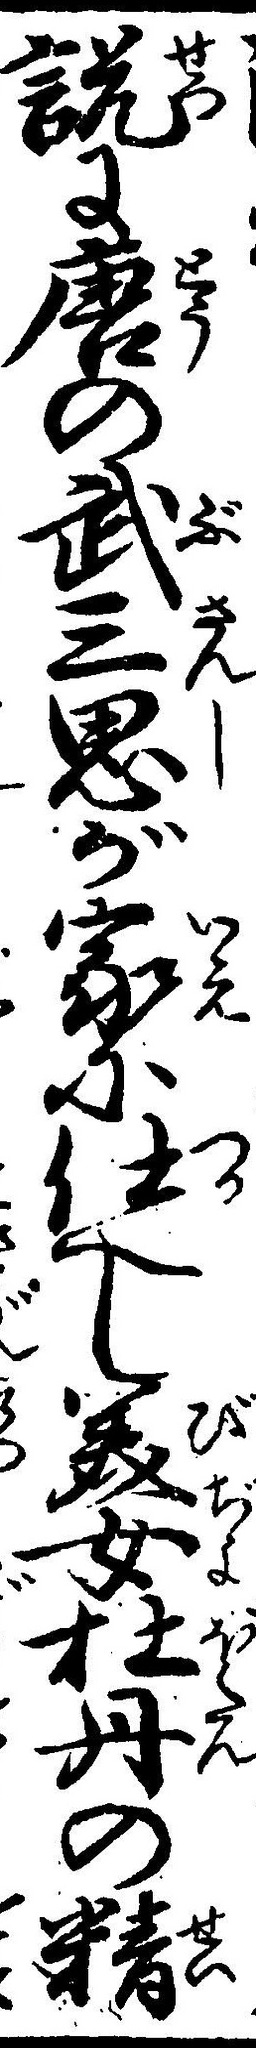説に唐の武三思が家に仕へし美女牡丹の精
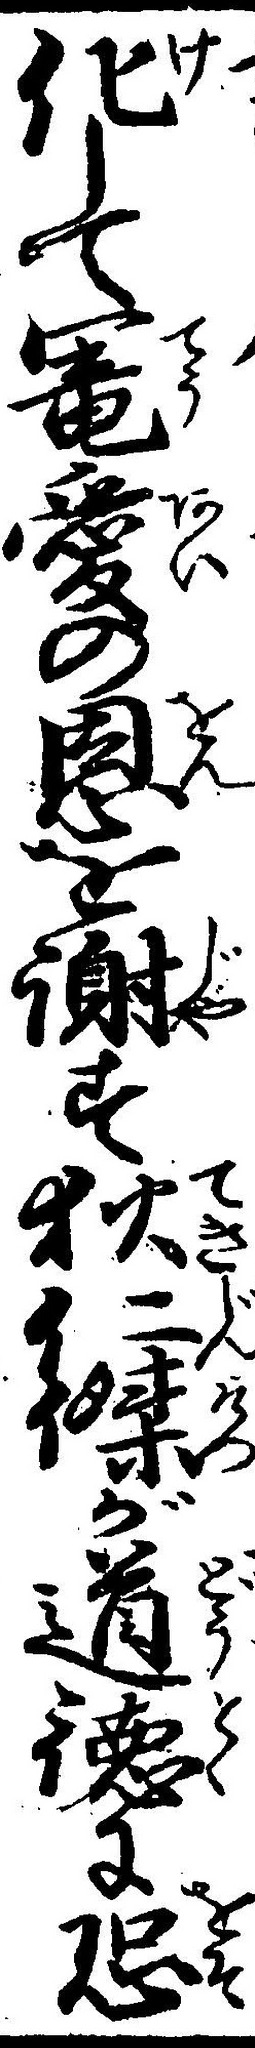化して寵愛の恩を謝す狄仁傑が道徳に恐

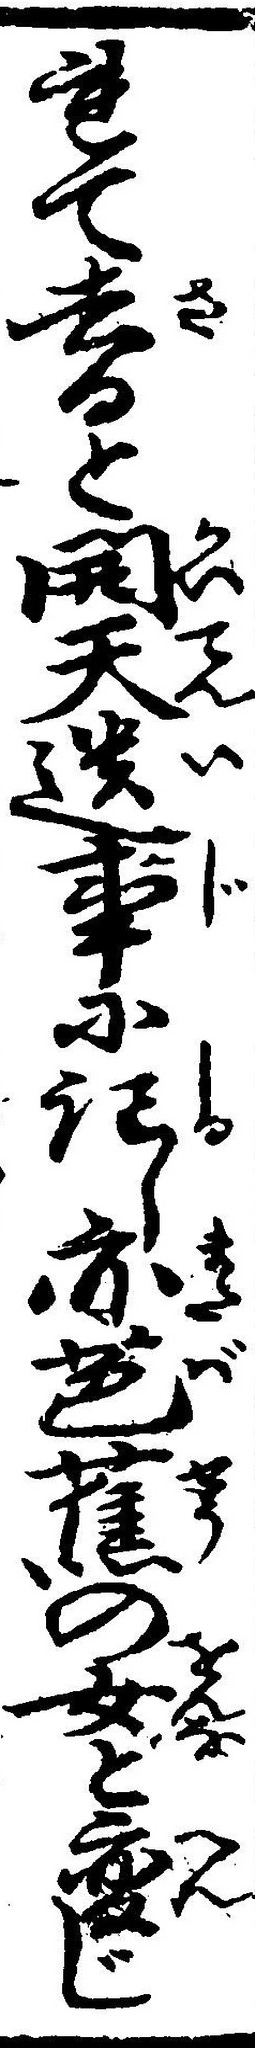れて去ると開天遺事に記し亦芭蕉の女と変じ
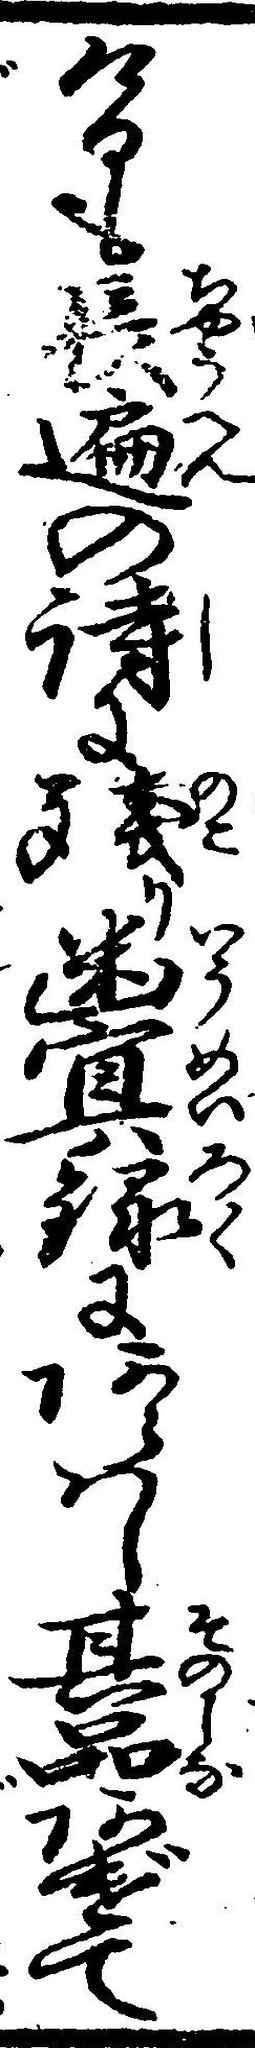けるも長遍の詩に残幽冥録にあらはし其品あげて
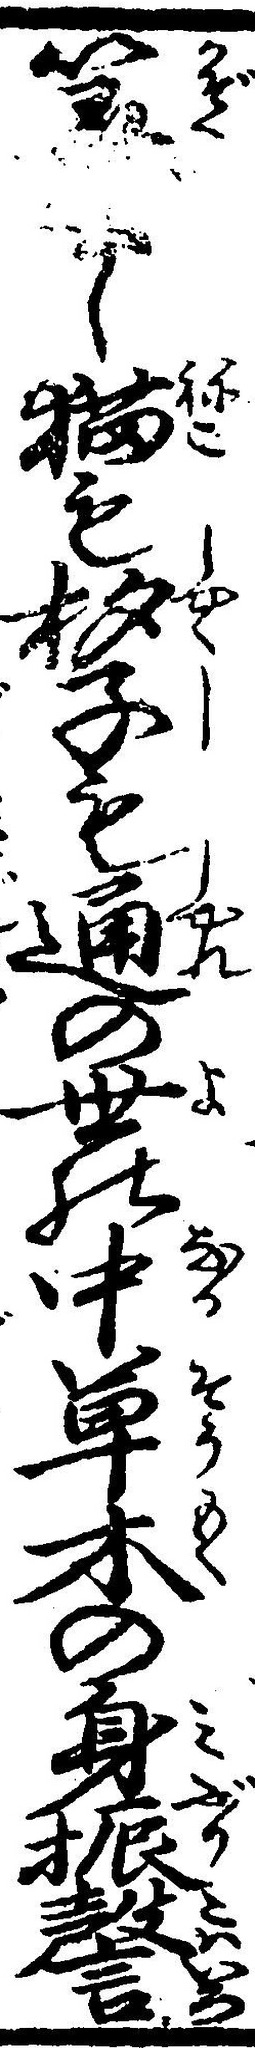算がたし猫も杓子も通の世の中草木の身振謦
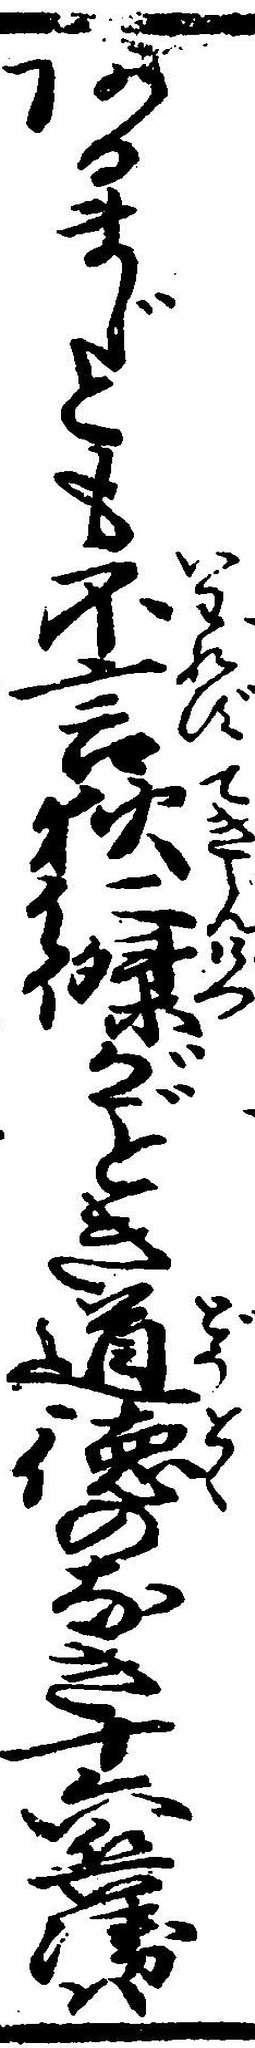あるまじとも不言狄仁傑がごとき道徳のなき十六兵衛は
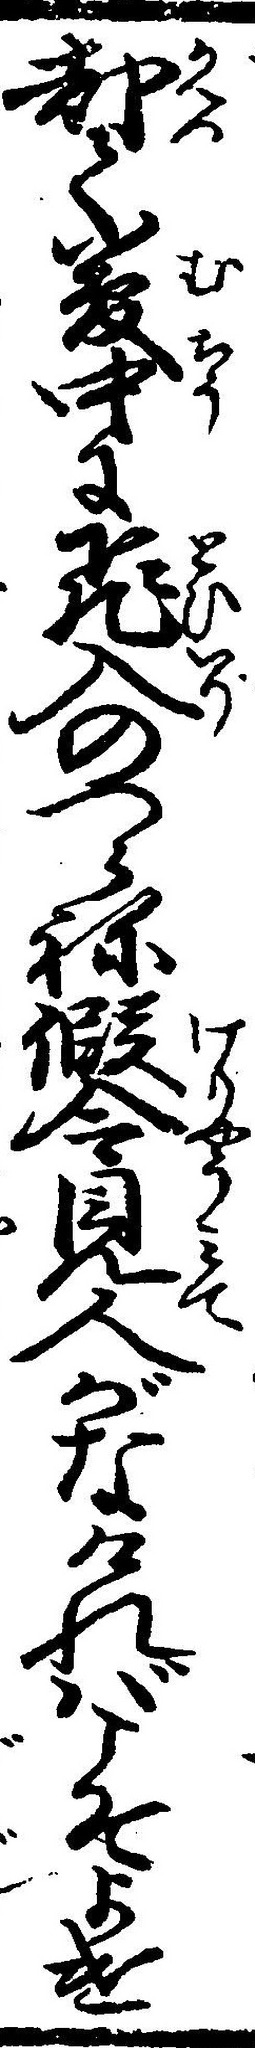却て夢中に飛入のつらね假令見人がなければこそよけ
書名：草木芝居化物退治 / 泉花堂三蝶(十六兵衛)作
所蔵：東京大学総合図書館 General Library in the University of Tokyo, JAPAN
